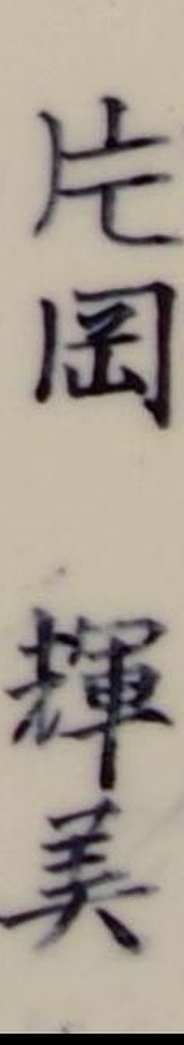片岡輝美
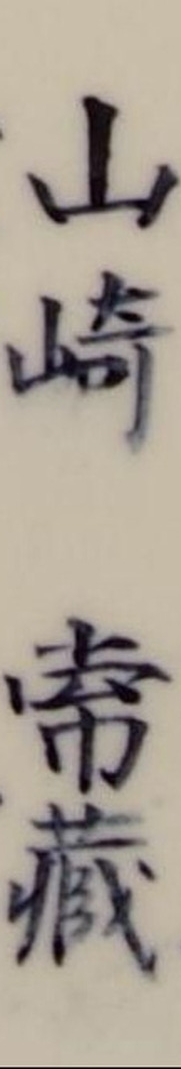山崎常蔵
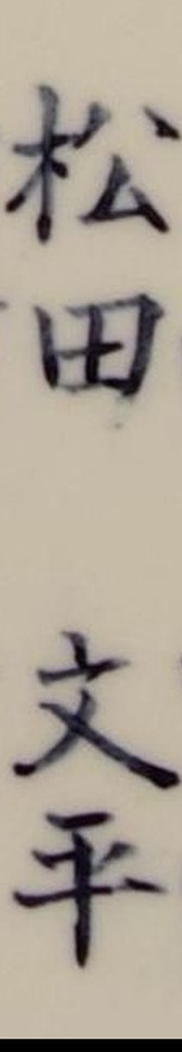松田文平
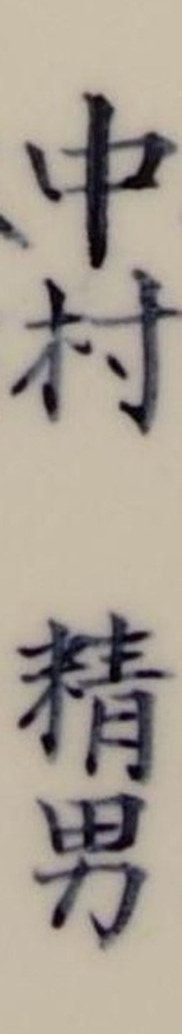中村精男
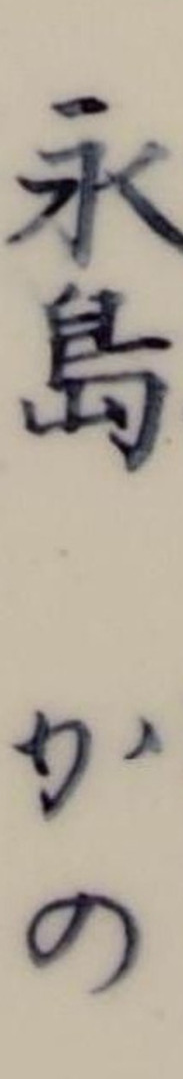永島かの
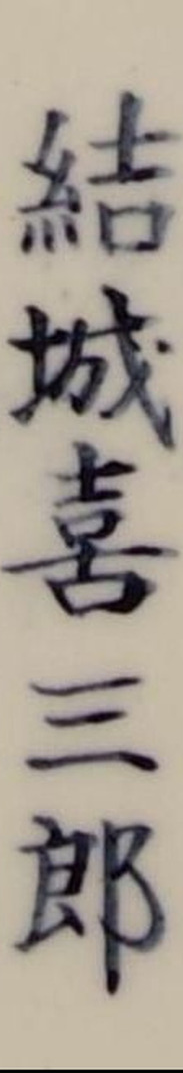結城喜三郎
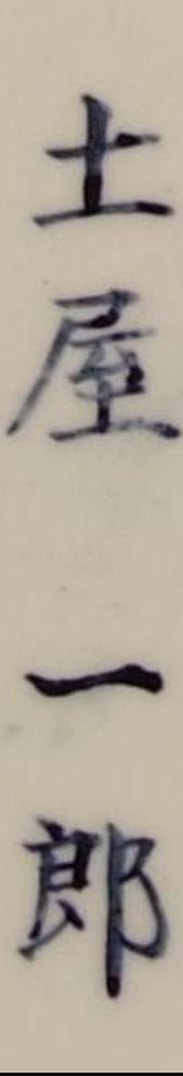土屋一郎
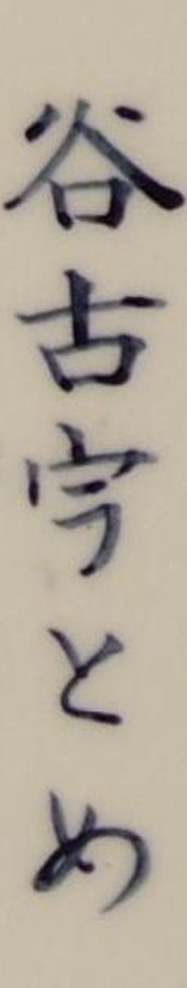答古宇とめ
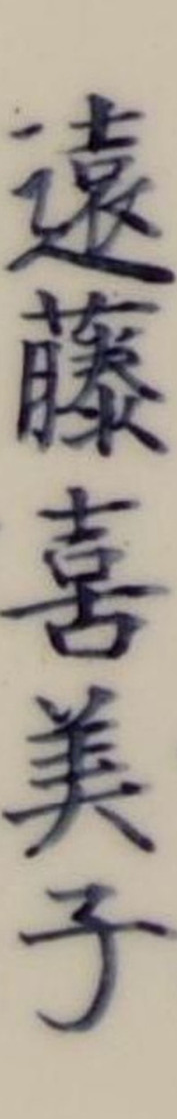遠藤喜美子
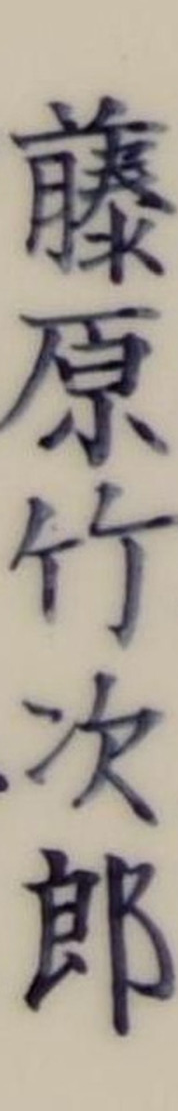藤原竹次郎
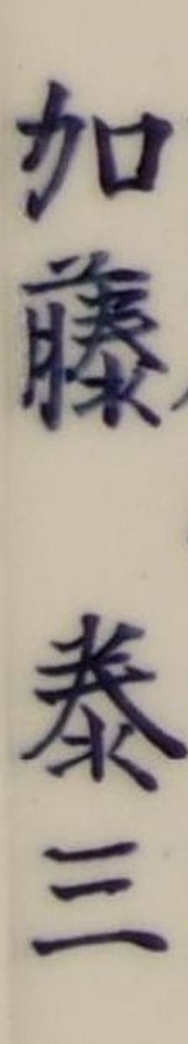加藤泰三

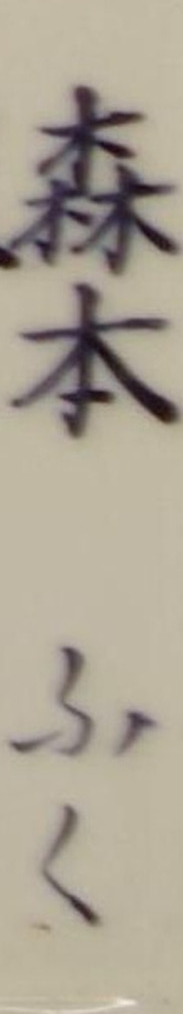森本ふく
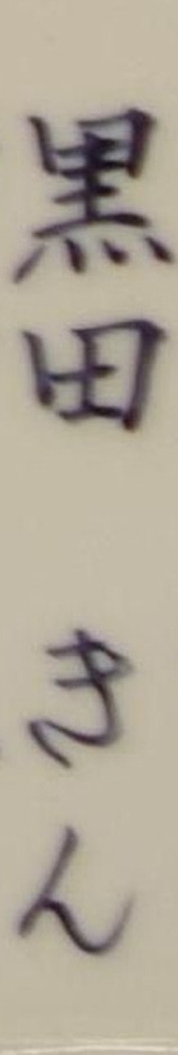黒田きん
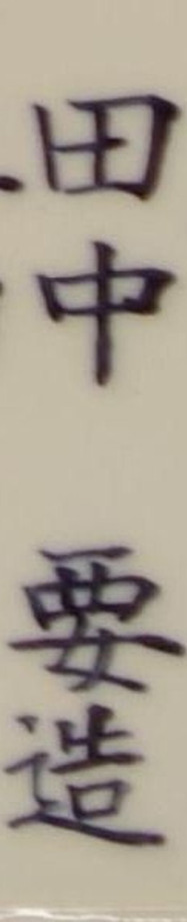田中要造
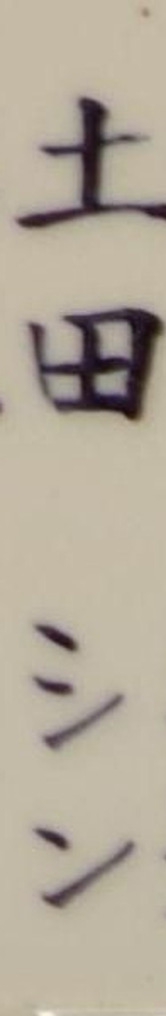土田シン
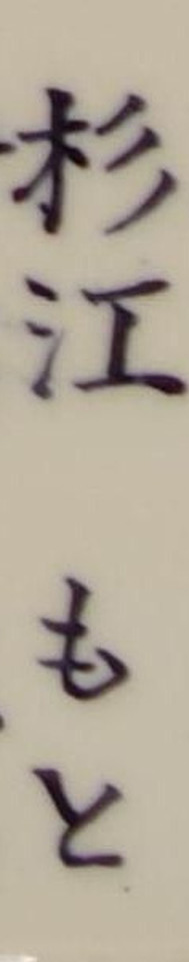杉江もと
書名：M~S
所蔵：高野山金剛峯寺
